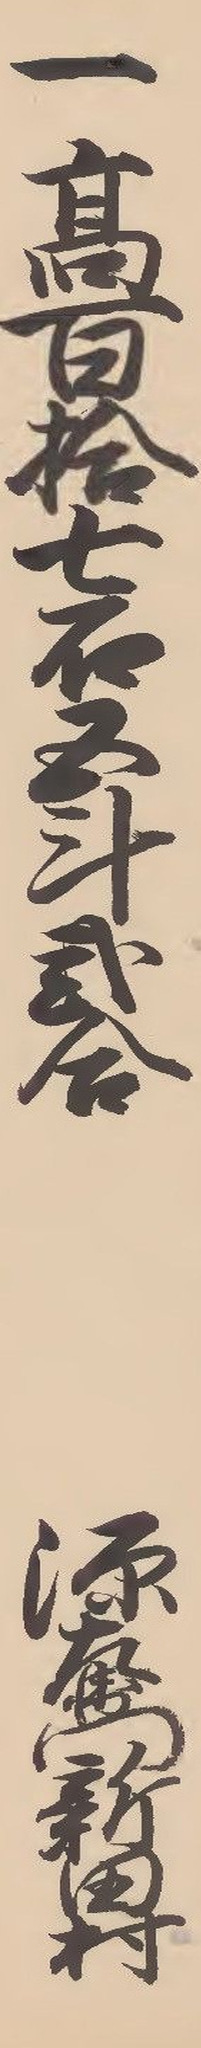一高百拾七石五斗弐合源左衛門新田村
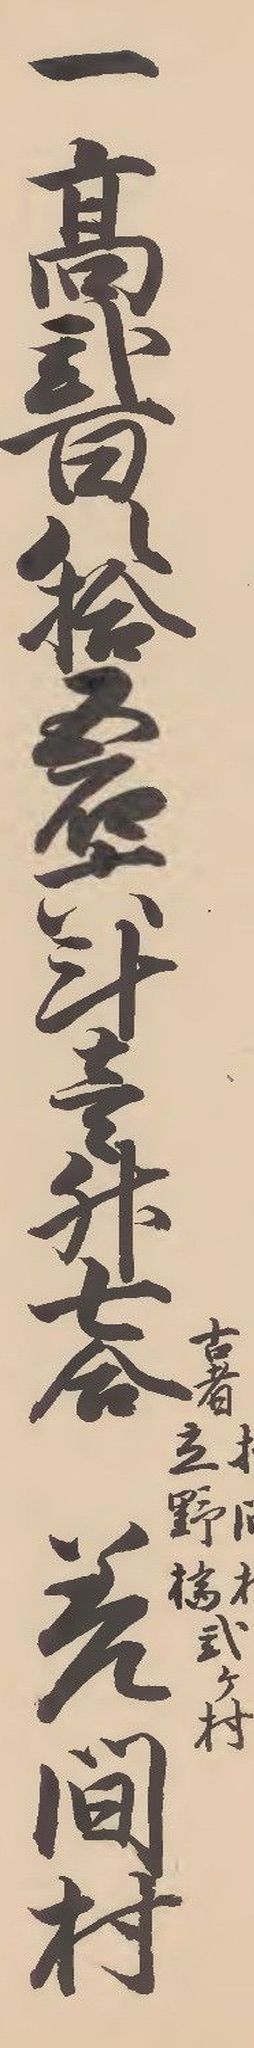一高弐百八拾五石六斗壱升七合差間村
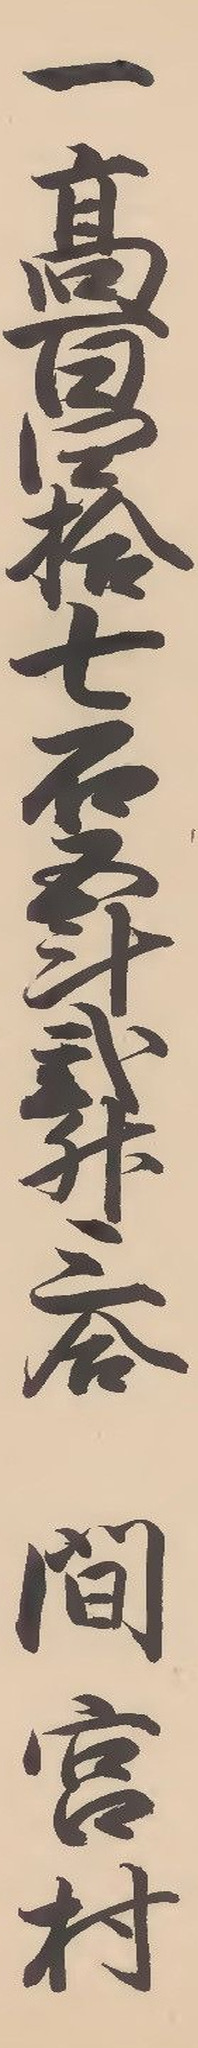一高百四拾七石五斗弐升三合間宮村
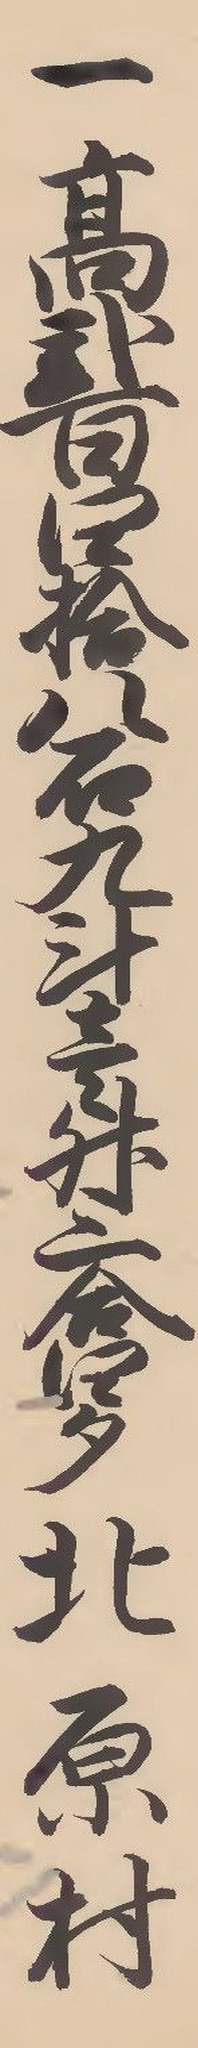一高弐百四拾八石九斗壱升三合四勺北原村

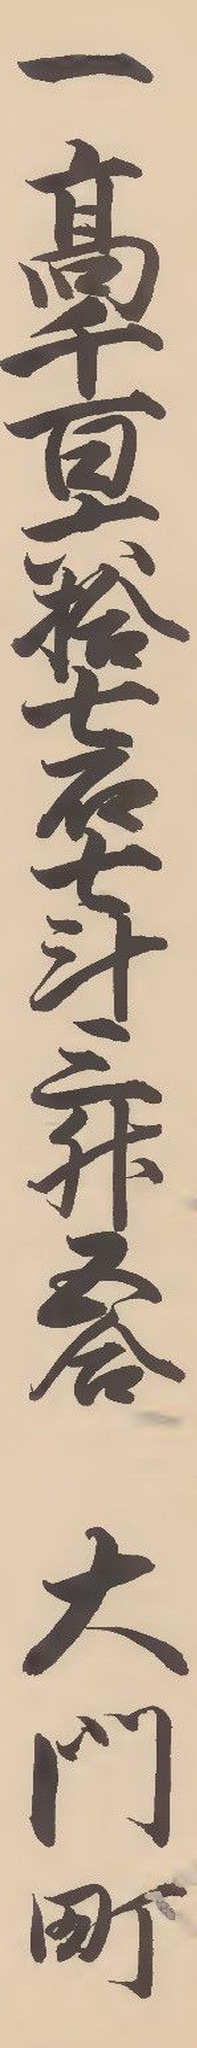一高千百六拾七石七斗三升五合大門町
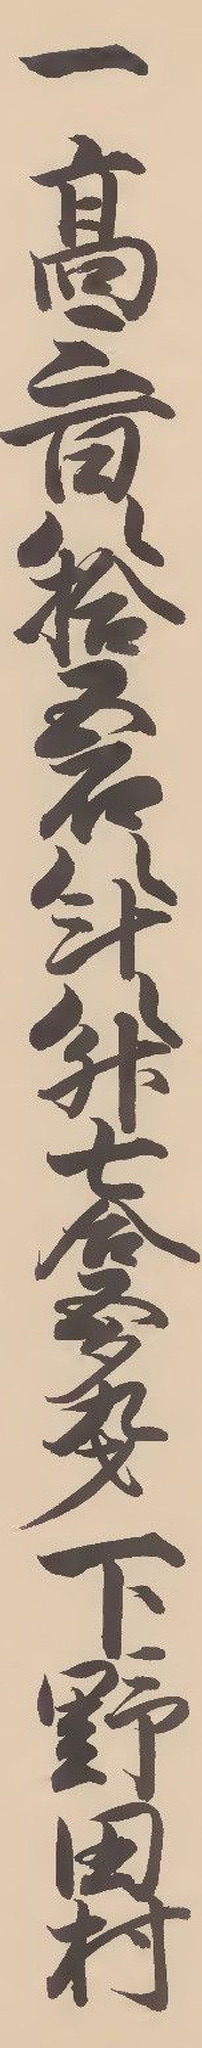一高三百拾八拾五石八斗八升七合五勺九才下野田村
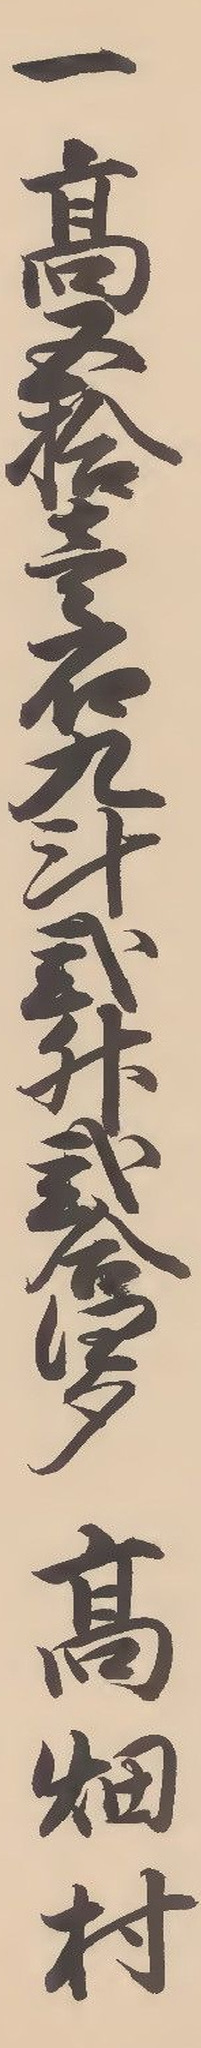一高五拾壱石九斗弐升弐合四勺高畑村
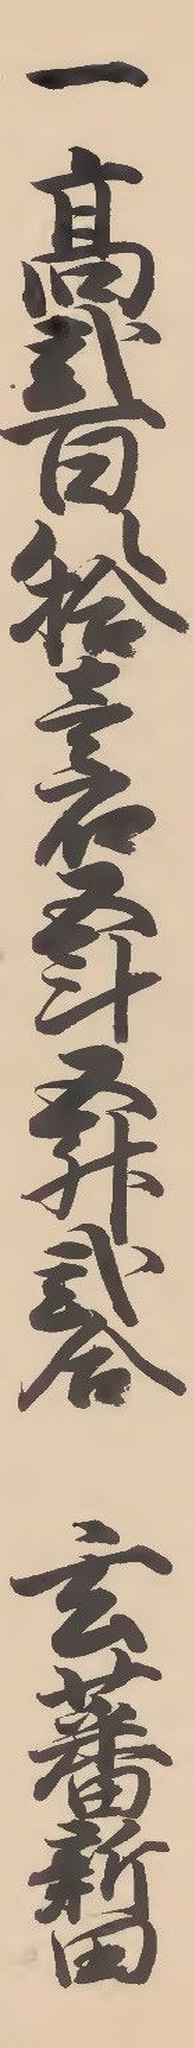一高弐百八拾壱石五斗五升弐合玄蕃新田
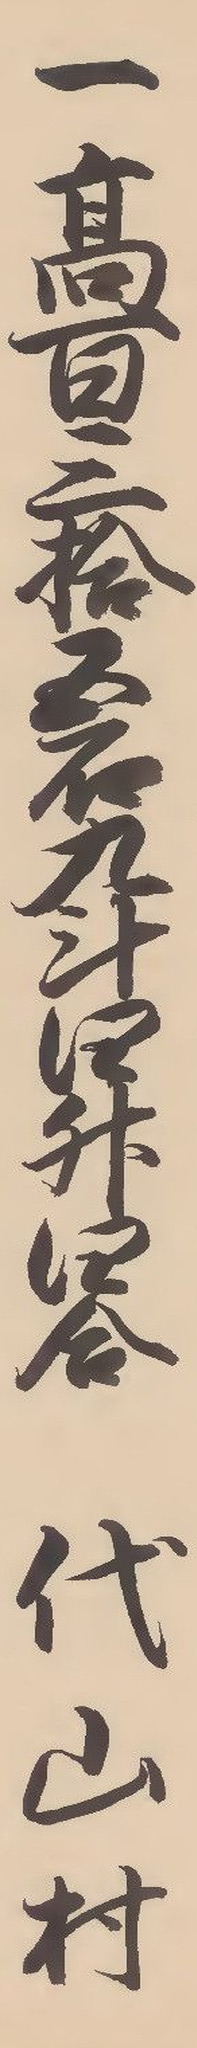一高百三拾五石九斗四升四合代山村
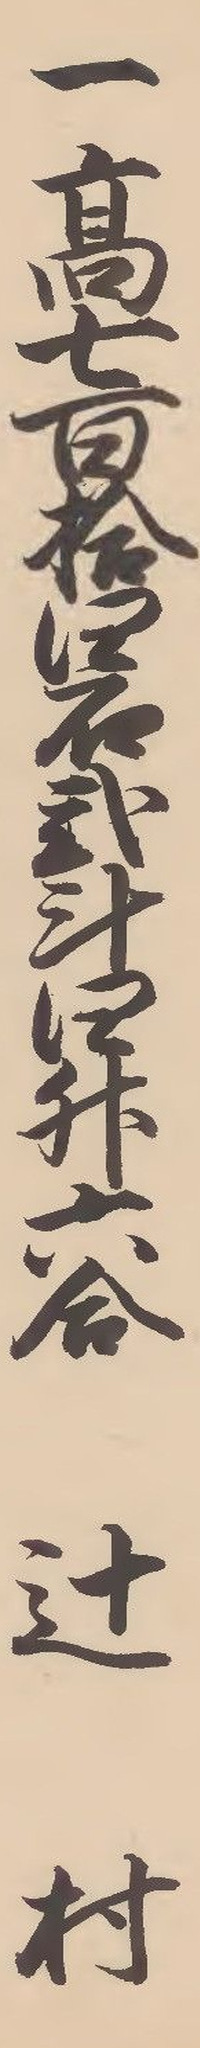一高七百拾四石弐斗四升六合辻村
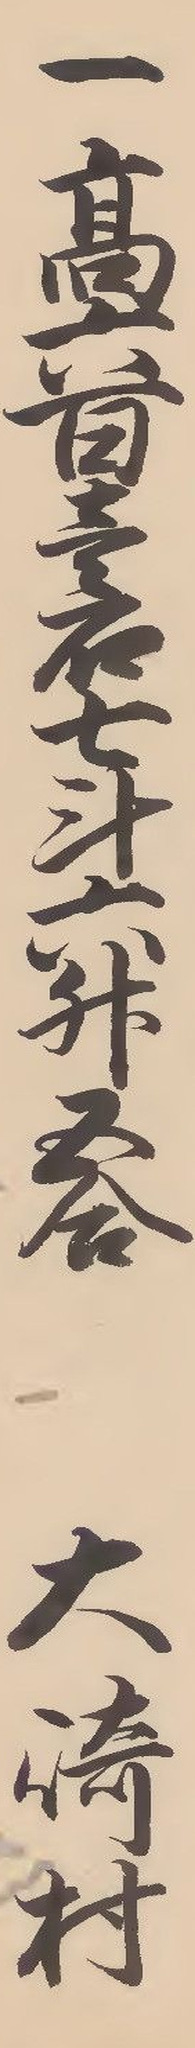一高六百壱石七斗六升五合大崎村

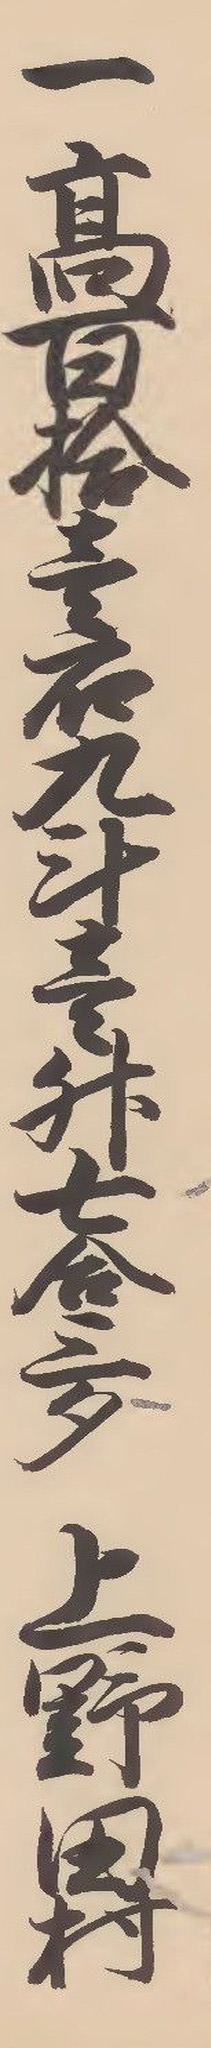一高百拾壱石九斗壱升七合三勺上野田村
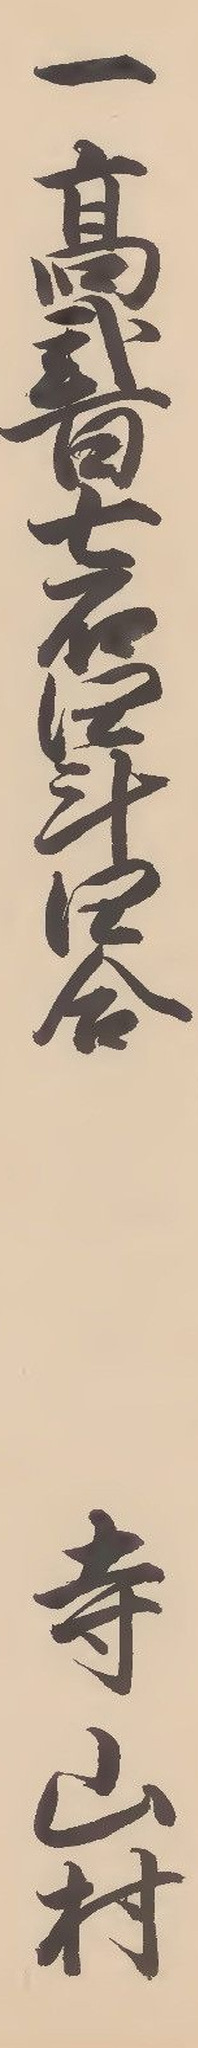一高弐百七石四斗四合寺山村
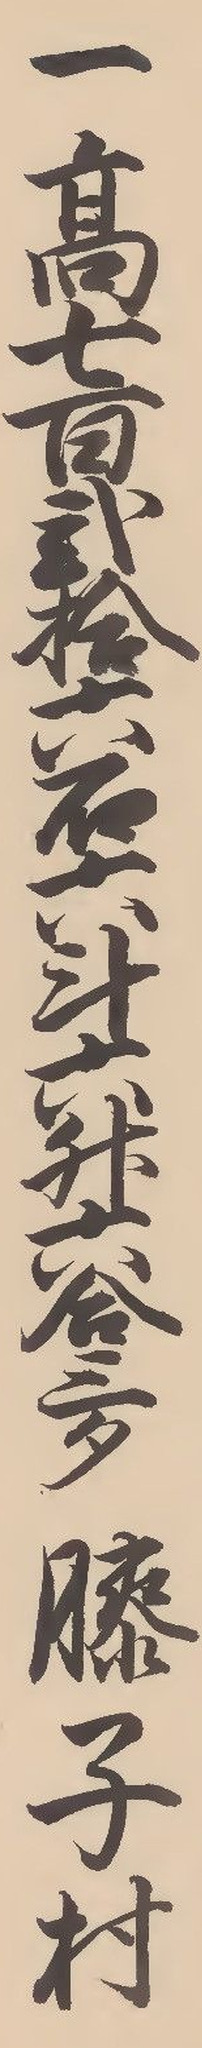一高七百弐拾六石六斗六升六合三勺膝子村
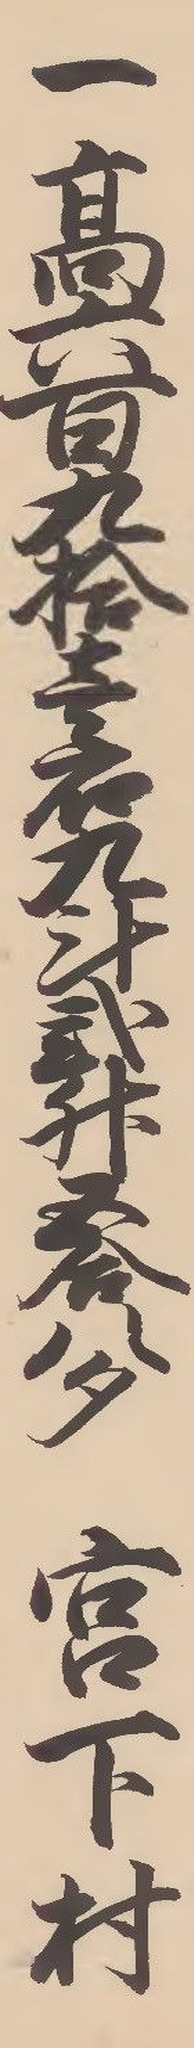一高六百九拾壱石九斗弐升五合八勺宮下村
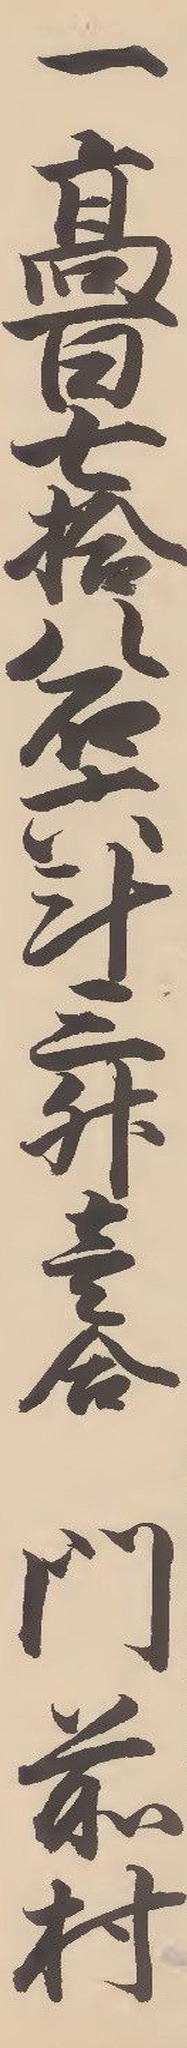一高百七拾八石六斗三升壱合門前村
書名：武蔵国郷帳　下
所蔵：国立公文書館 National Archives of Japan
